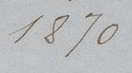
1870
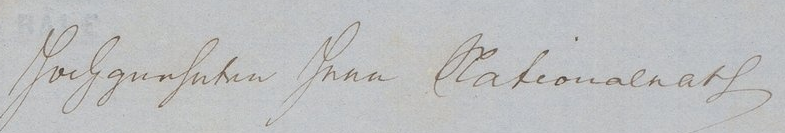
Hochgeehrter Herr Nationalrath
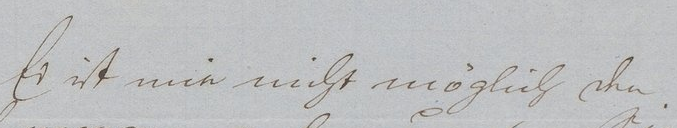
Es ist mir nicht möglich der
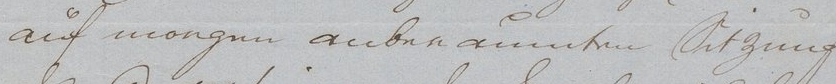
auf morgen anberaumten Sitzung
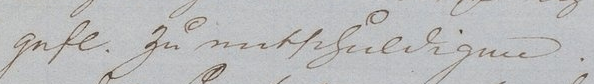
gefl. zu entschuldigen.
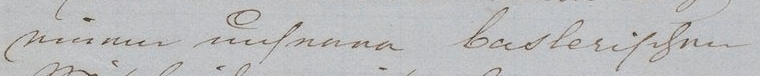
einem unserer baslerischen
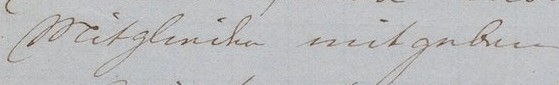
Mitglieder mitgeben.
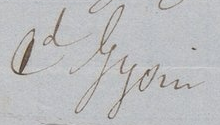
Cd Gysin
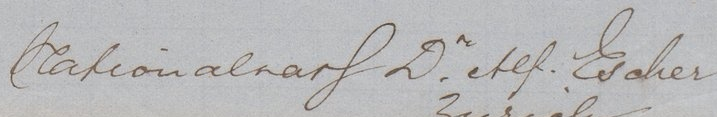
Nationalrath Dr Alf. Escher
